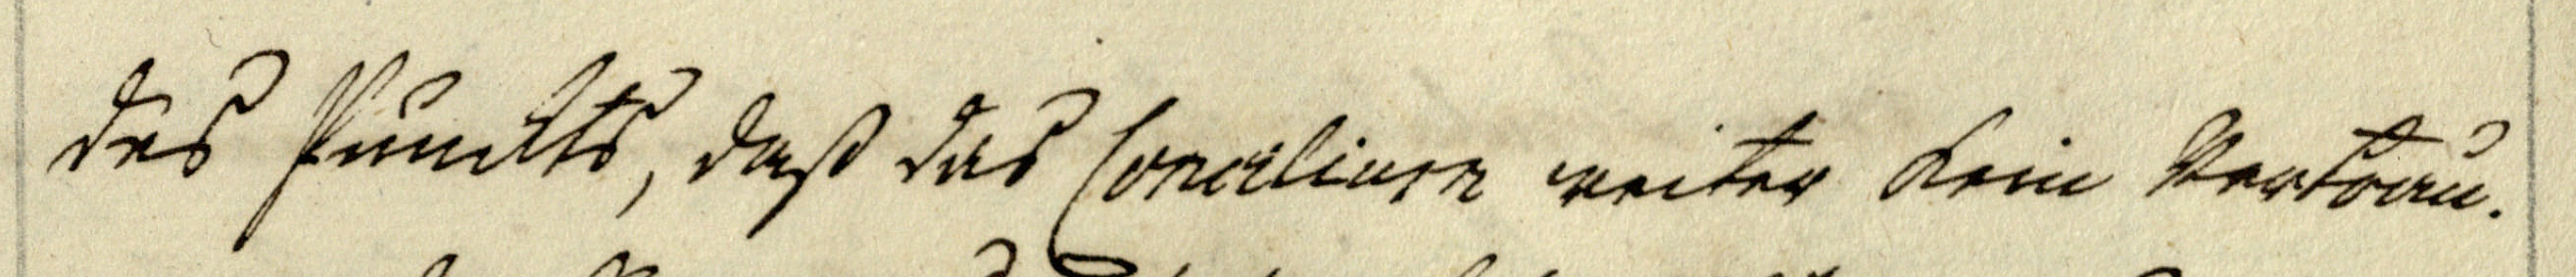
des Punckts, daß das Concilium weiter kein Vertrau¬
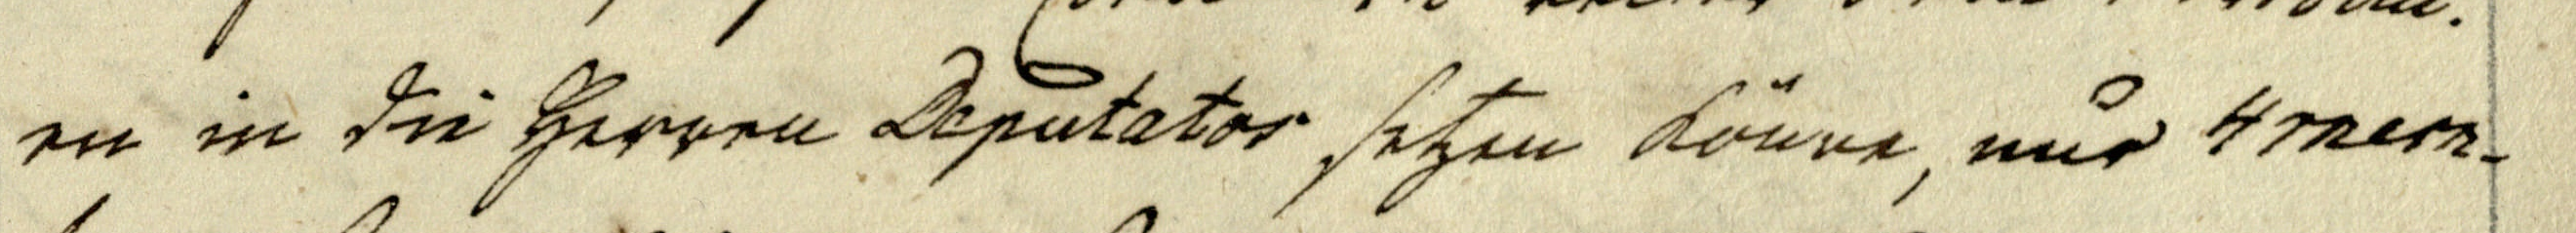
en in die Herren Deputatos setzen könne, nur 4 mem¬
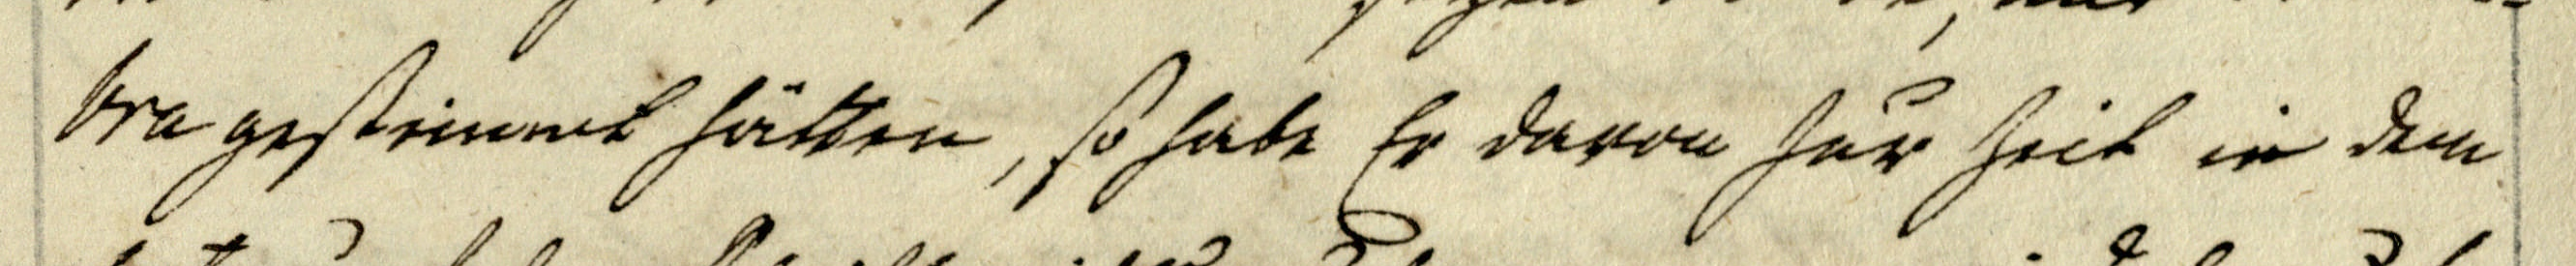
bra gestimmt hätten, so habe Er davon zur Zeit in dem
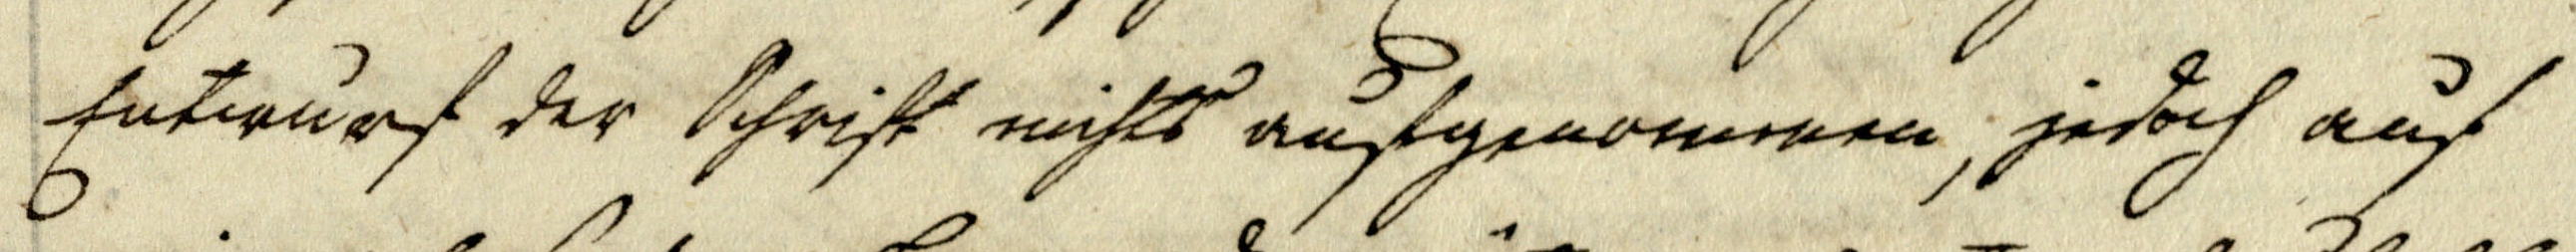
Entwurf der Schrift nichts aufgenommen, jedoch auf
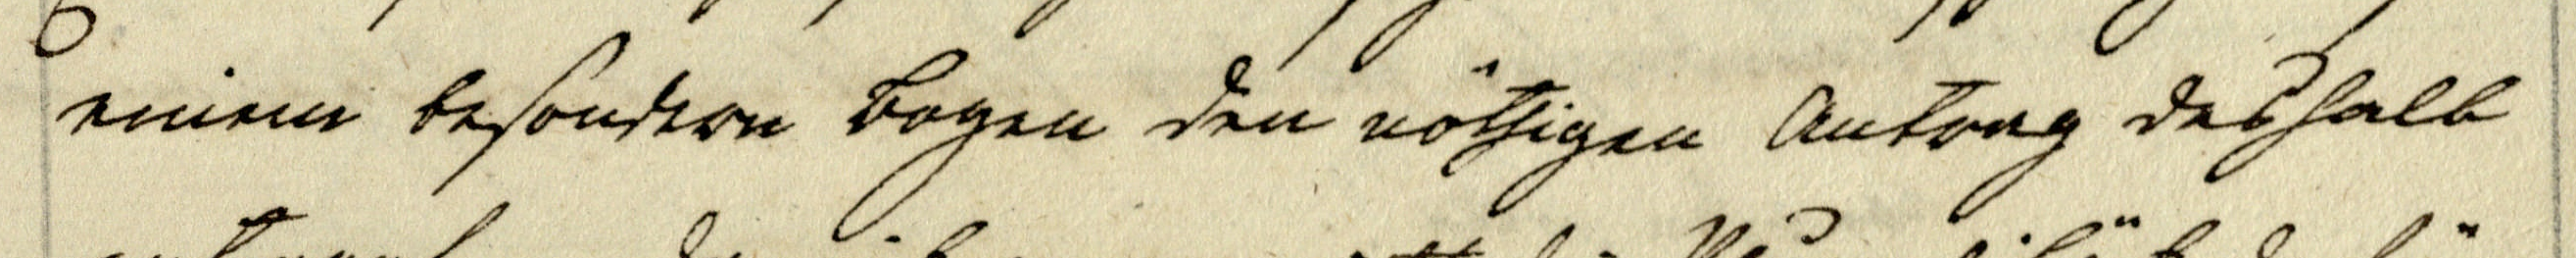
einem besondern Bogen den nöthigen Antrag deshalb
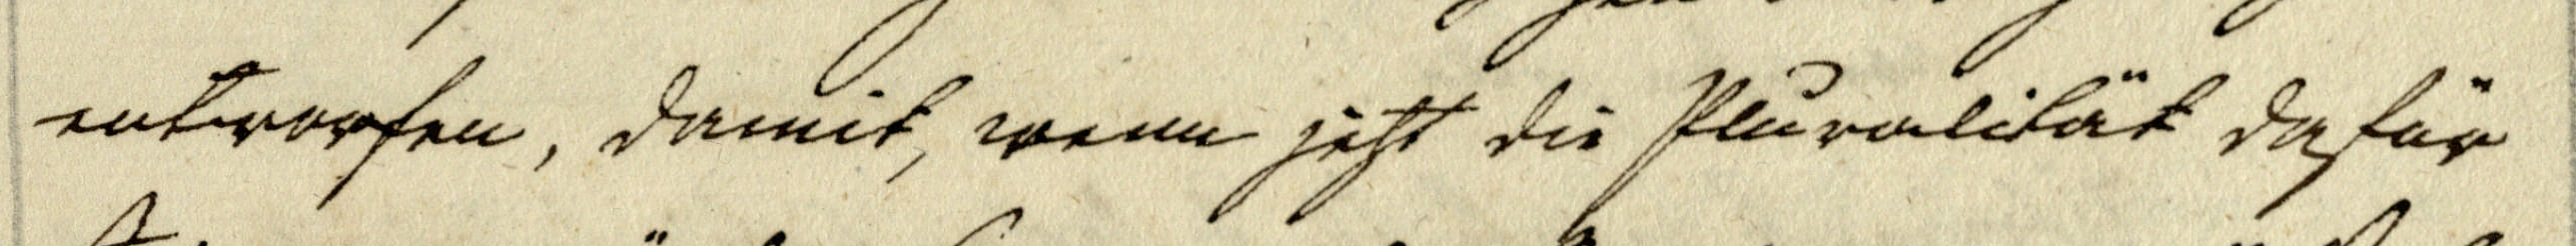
entworfen, damit, wenn jetzt die Pluralität dafür
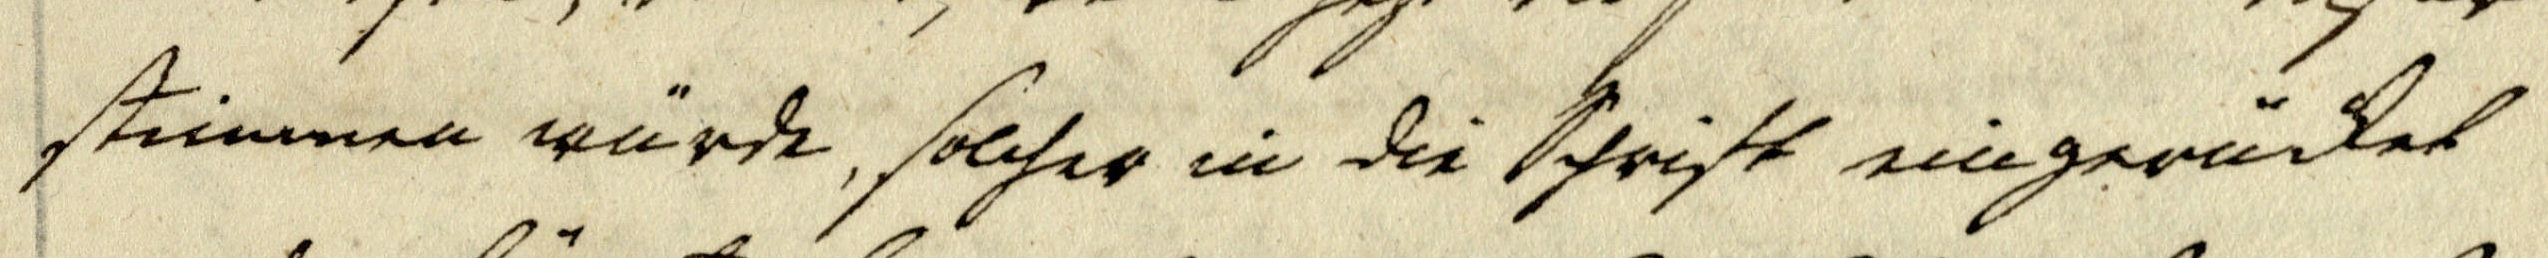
stimmen würde, solcher in die Schrift eingerücket
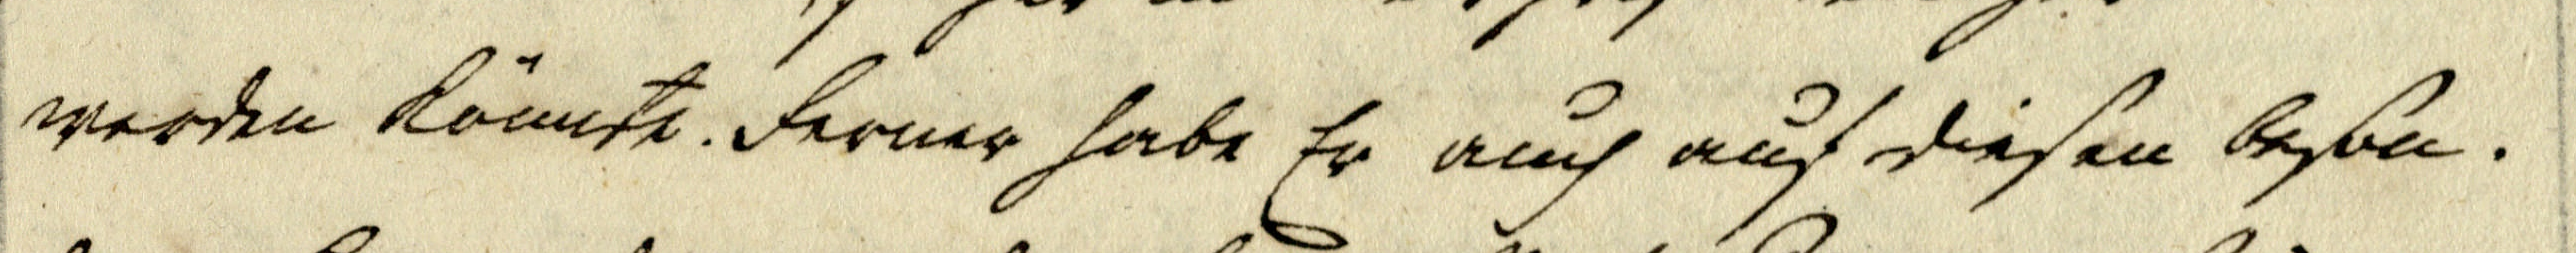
werden könnte. Ferner habe Er auch auf diesen beson¬
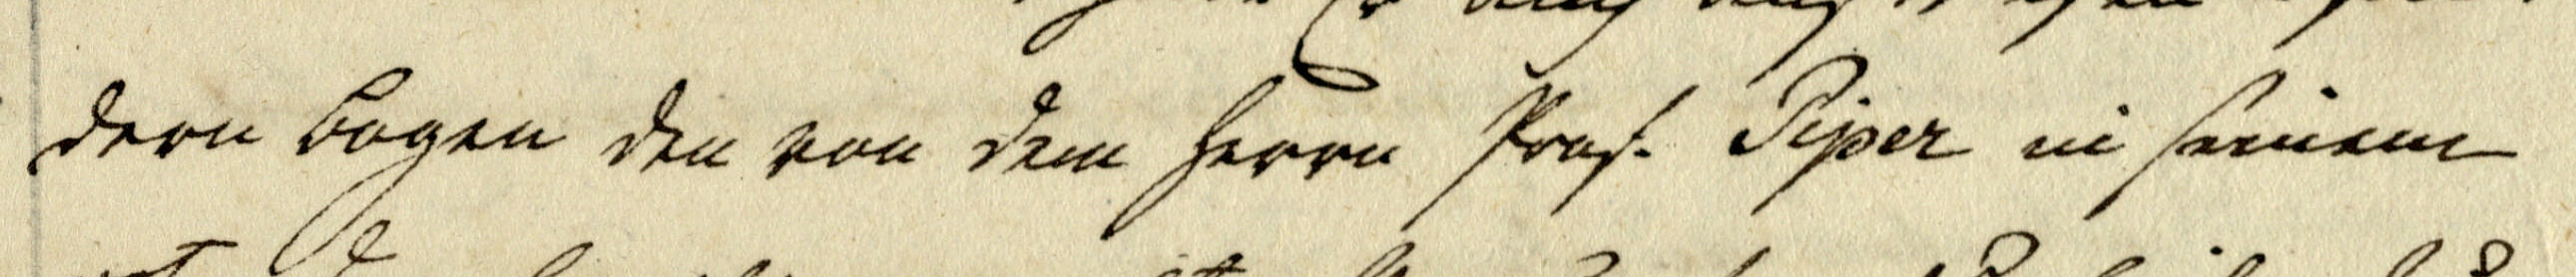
dern Bogen den von dem Herrn Prof. Piper in seinem
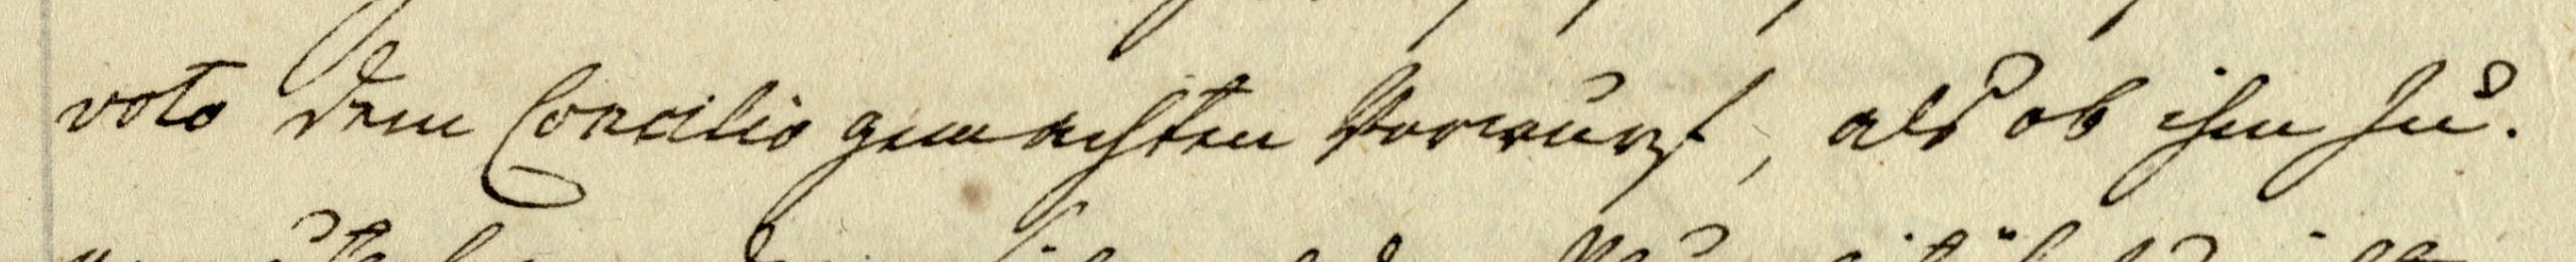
voto dem Concilio gemachten Vorwurf, als ob ihm zu¬
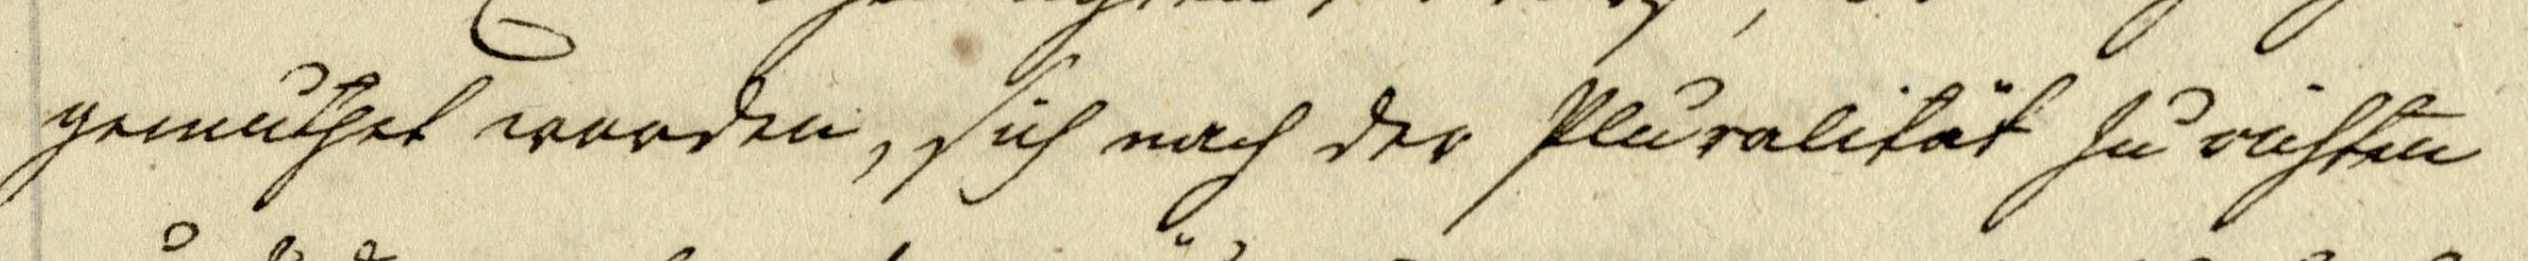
gemuthet worden, sich nach der Pluralität zu richten
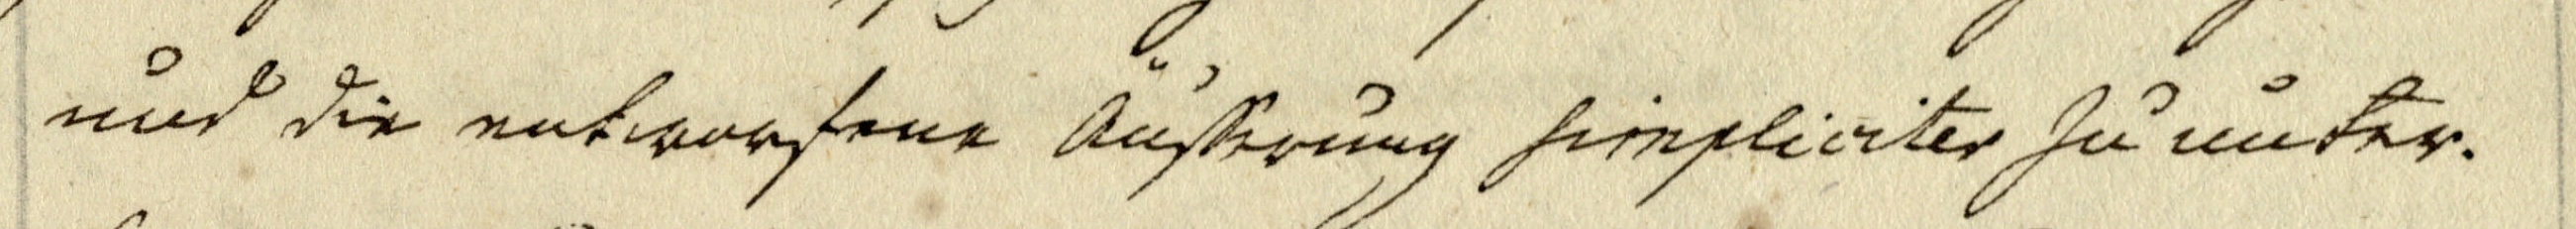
und die entworfene Äusserung simpliciter zu unter¬
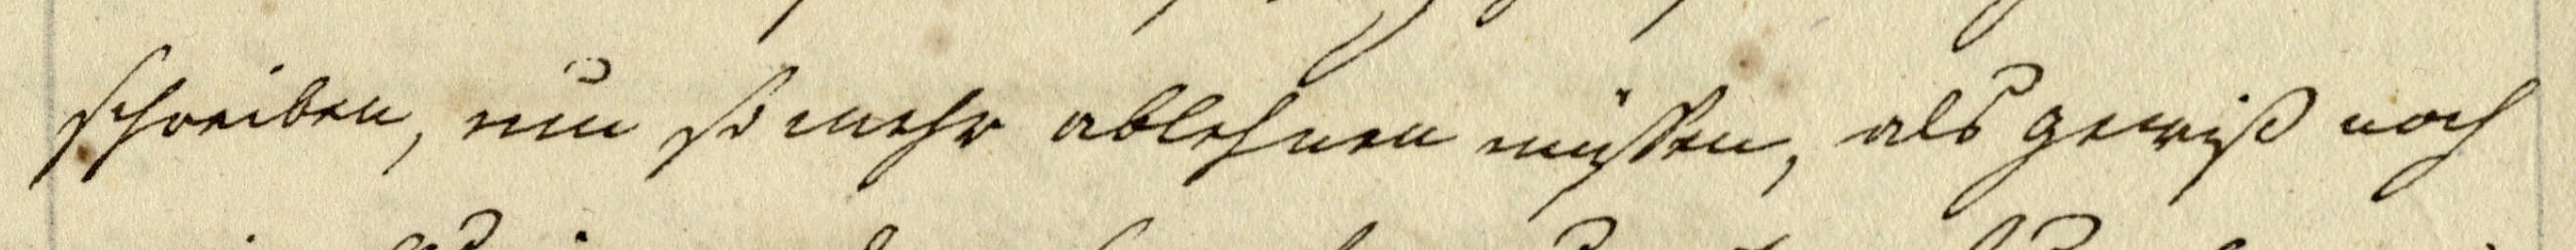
schreiben, um so mehr ablehnen müssen, als gewiß noch
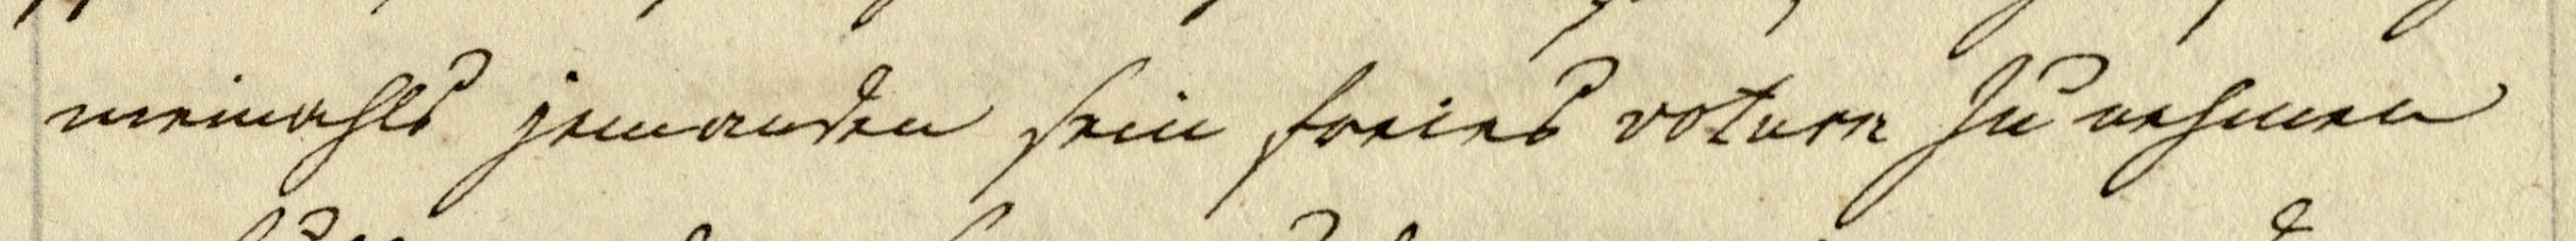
niemahls jemanden sein freies votum zu nehmen
